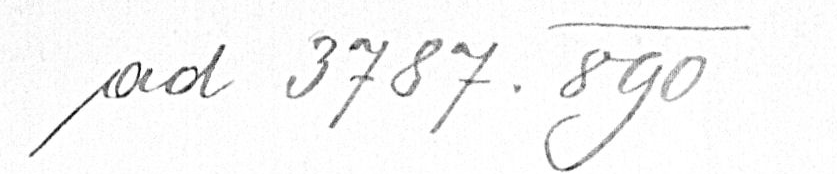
ad 3787. 890
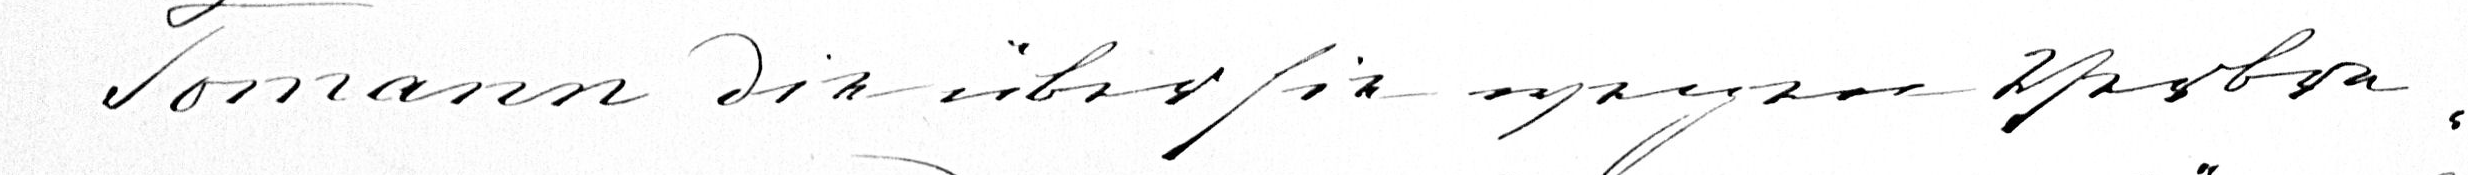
Tomann die über sie wegen Verbre¬
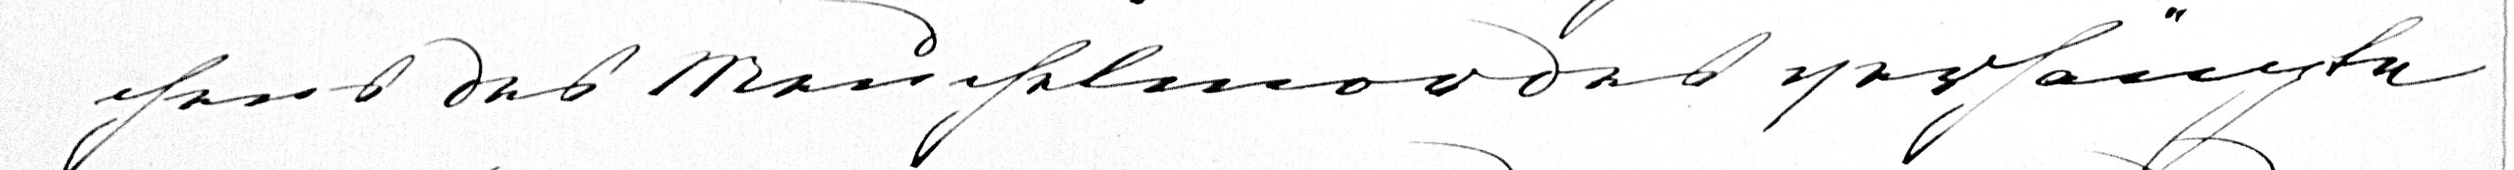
chens des Meuchelmordes verhängte
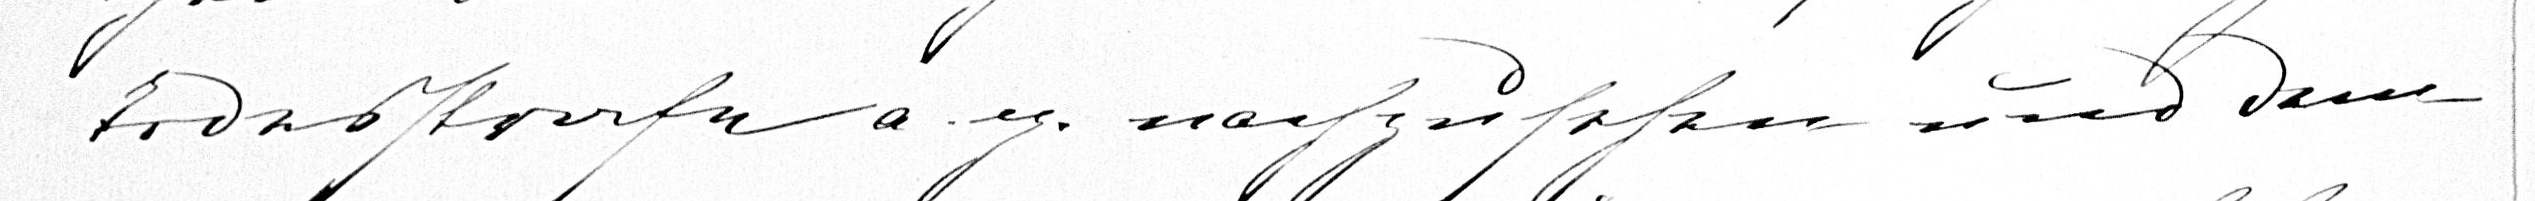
Todesstrafe a. g. nachzusehen und dem
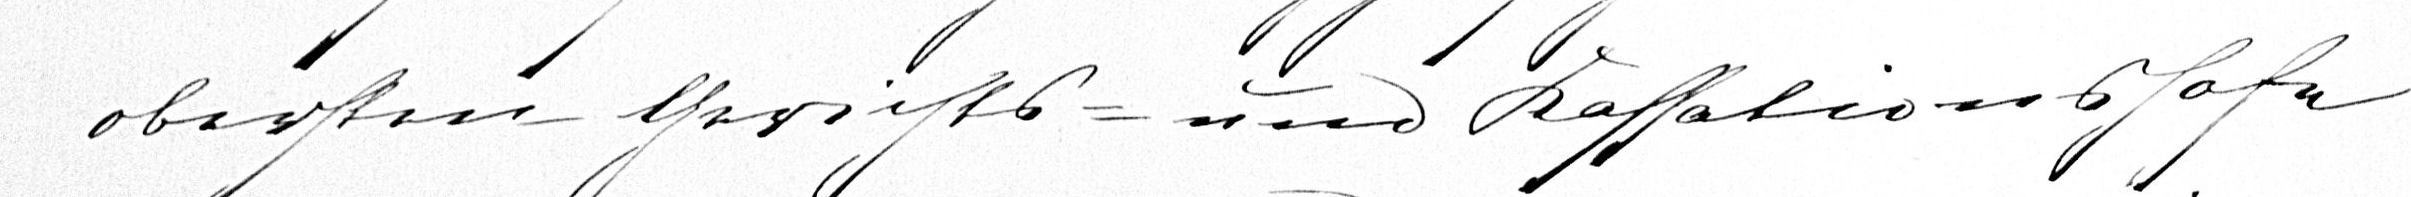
obersten Gerichts- und Kassationshofe
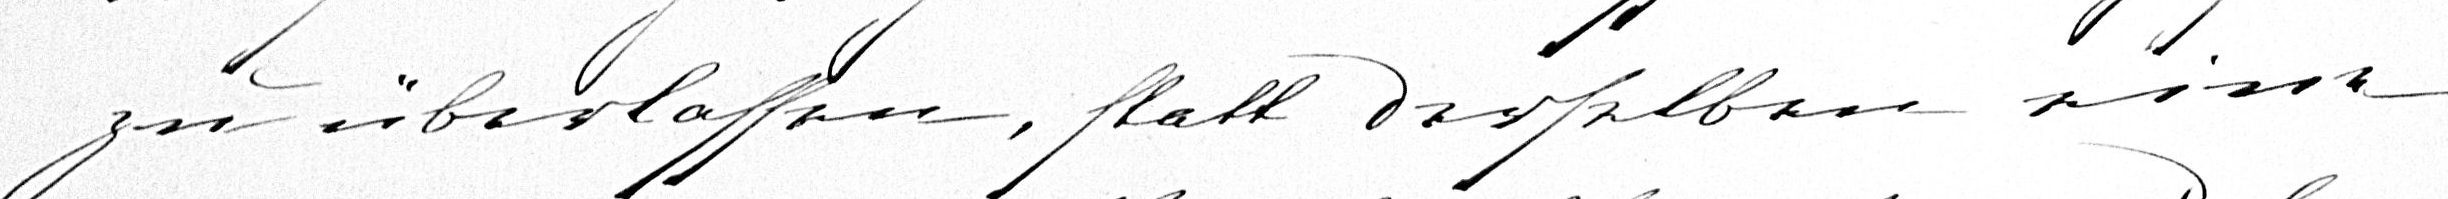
zu überlassen, statt derselben eine
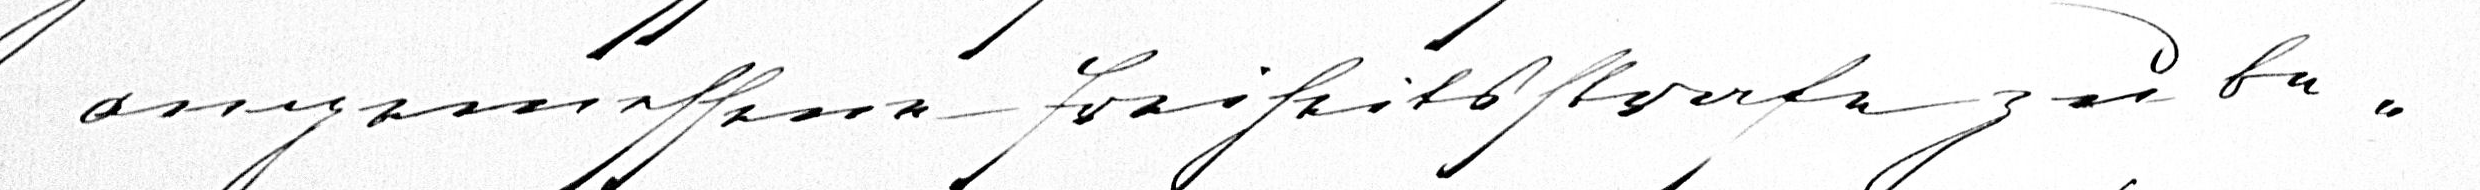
angemessene Freiheitsstrafe zu be¬
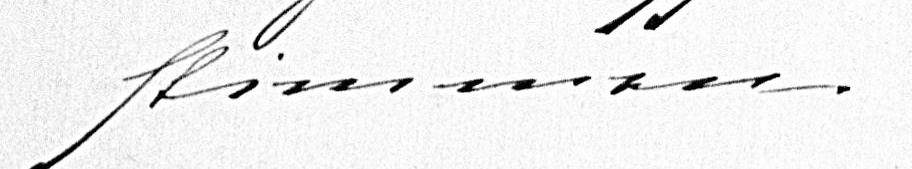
stimmen.
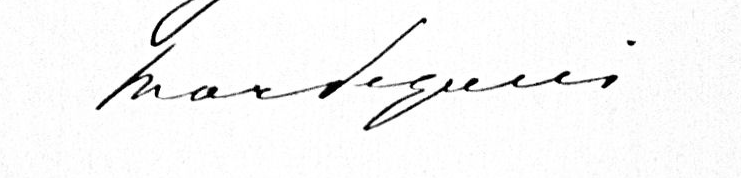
xx
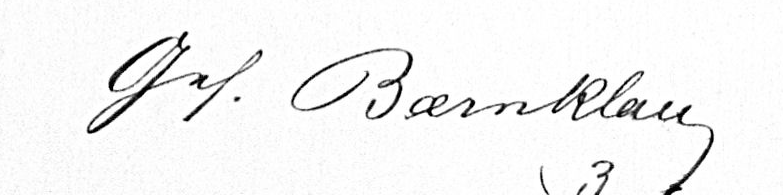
Ges. Barnklau
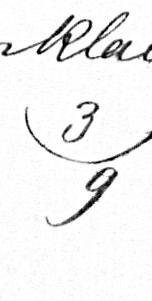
3 9
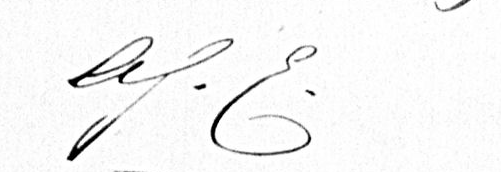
Ah.E.
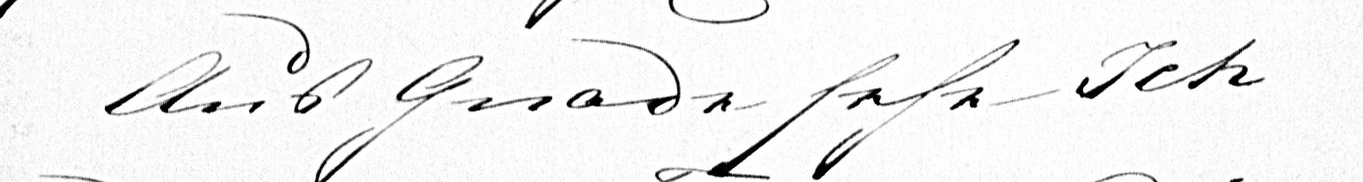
Aus Gnade sehe Ich
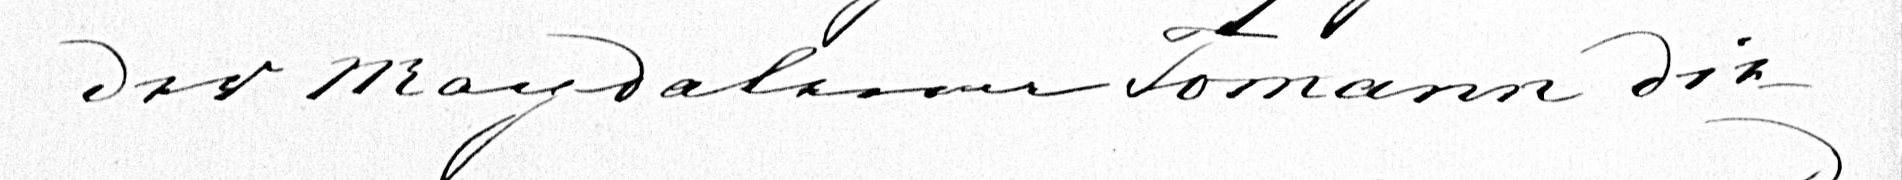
der Magdalena Tomann die
